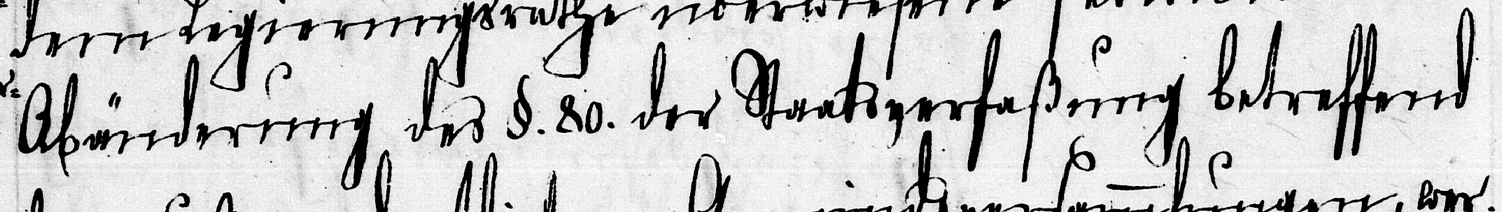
Abänderung des §. 80. der Staatsverfaßung betreffend
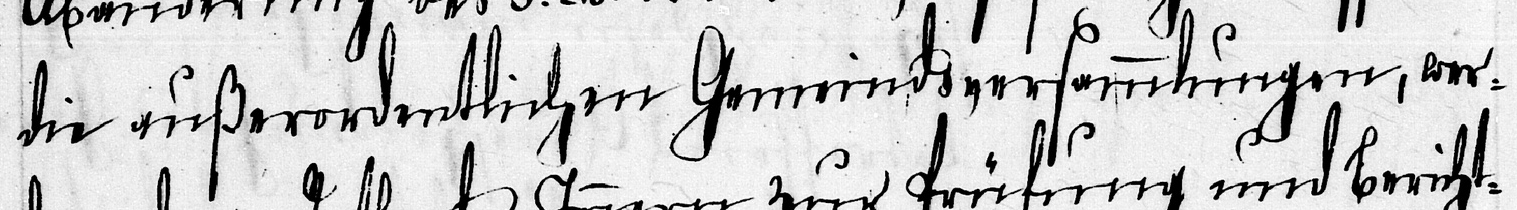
die außerordentlichen Gemeindsversammlungen, wer¬
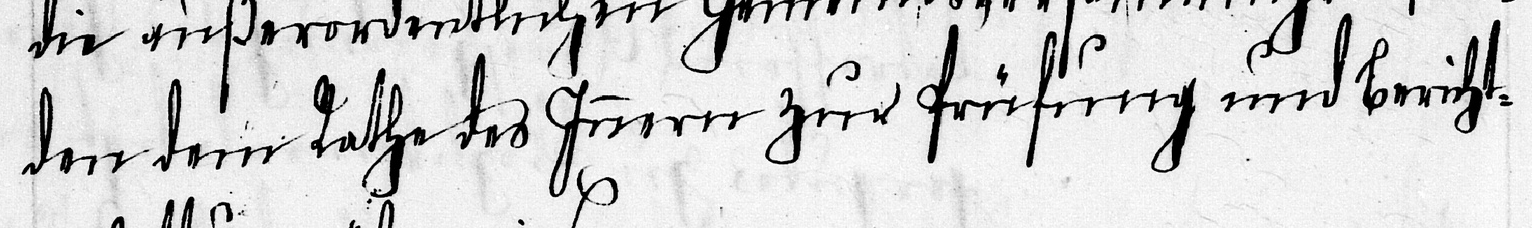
den dem Rathe des Innern zur Prüfung und Bericht¬
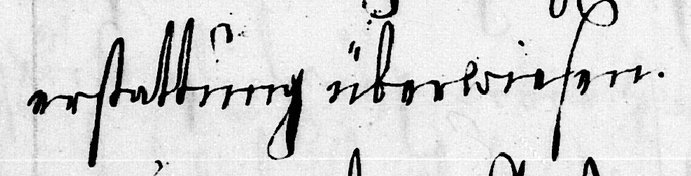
erstattung überwiesen.
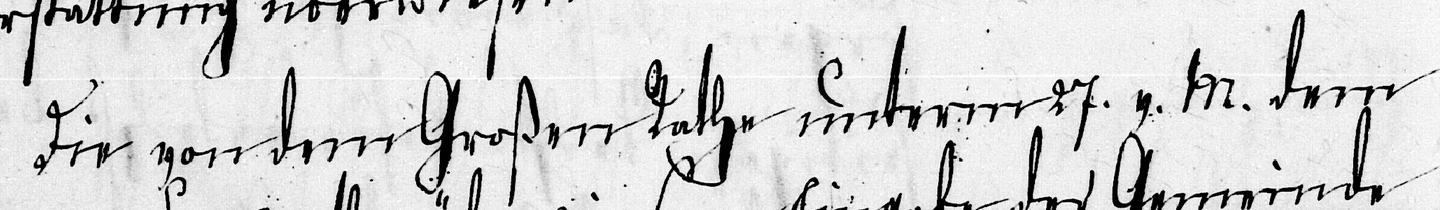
Die von dem Großen Rathe unterm 27. v. M. dem
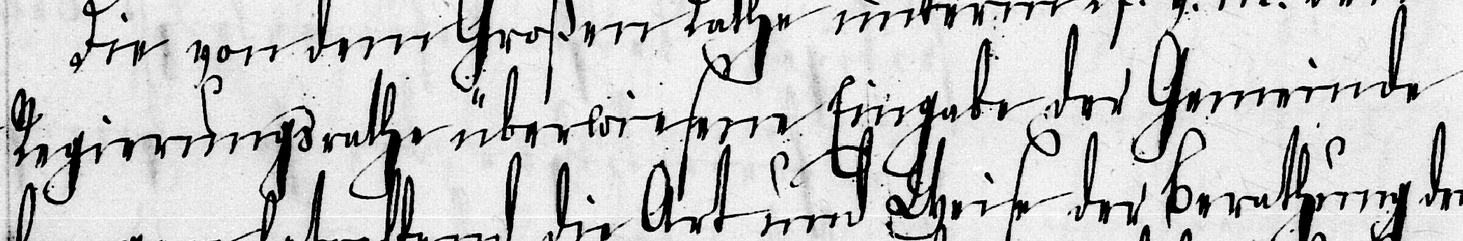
Regierungsrathe überwiesene Eingabe der Gemeinde
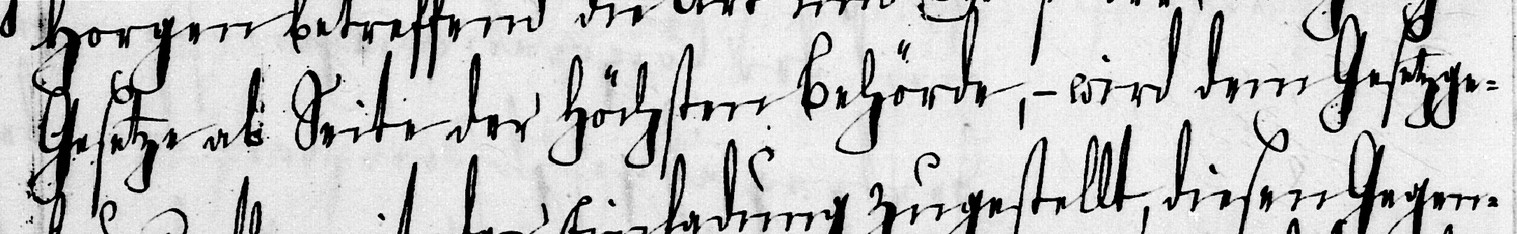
Gesetze ab Seite der Höchsten Behörde, – wird dem Gesetzge¬
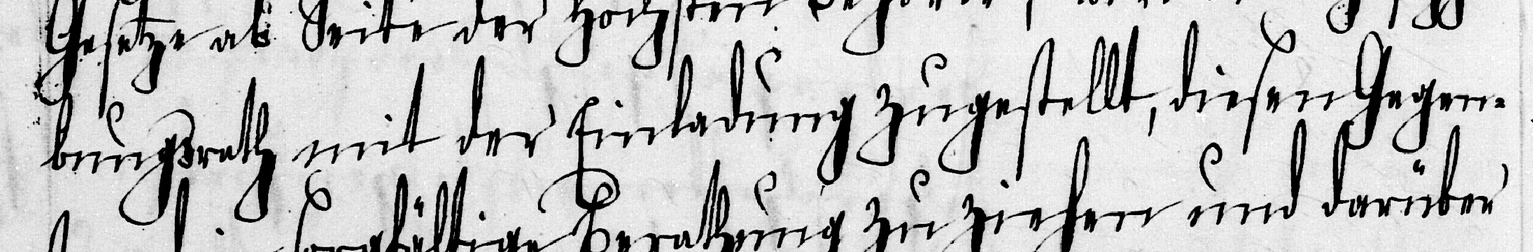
bungsrath mit der Einladung zugestellt, diesen Gegen¬
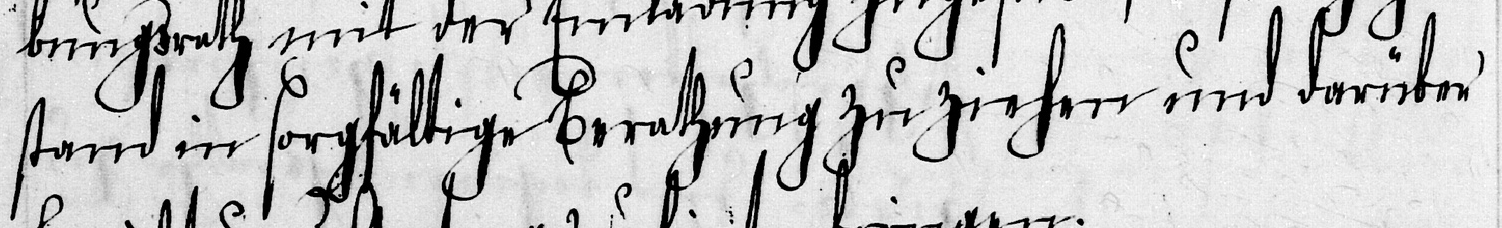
stand in sorgfältige Berathung zu ziehen und darüber
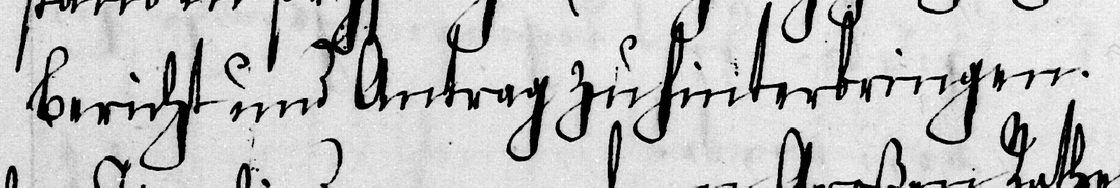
Bericht und Antrag zu hinterbringen.
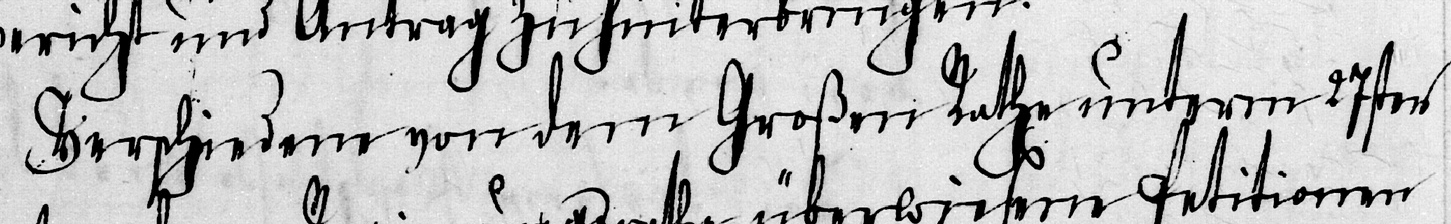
Verschiedene von dem Großen Rathe unterm 27sten
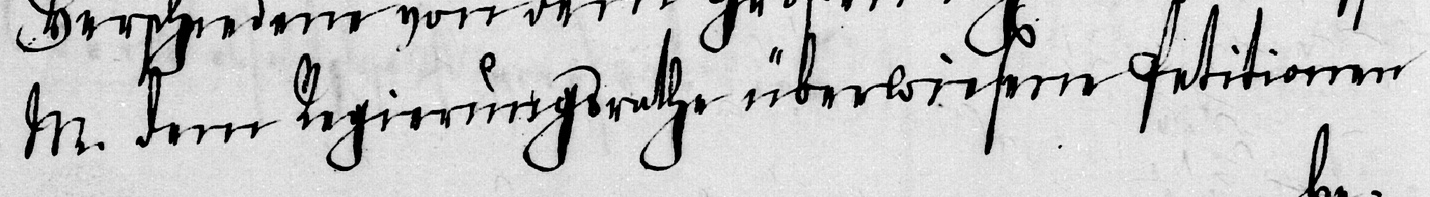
M. dem Regierungsrathe überwiesene Petitionen
